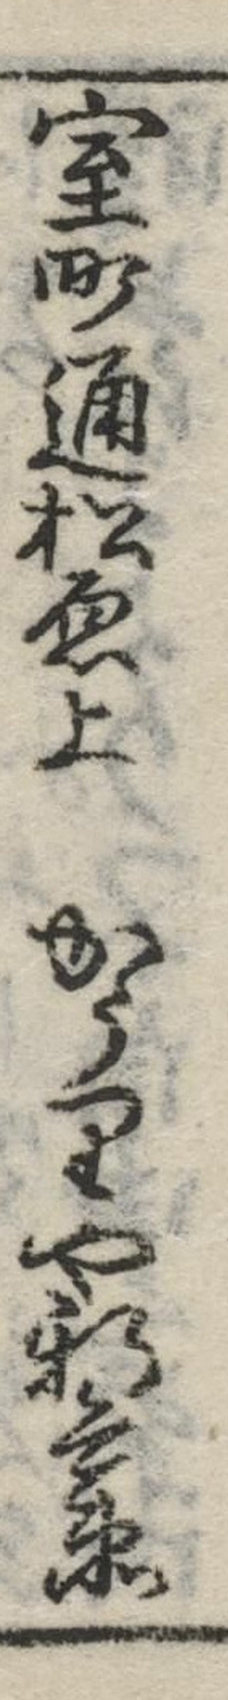室町通松原上かうりや新兵衛
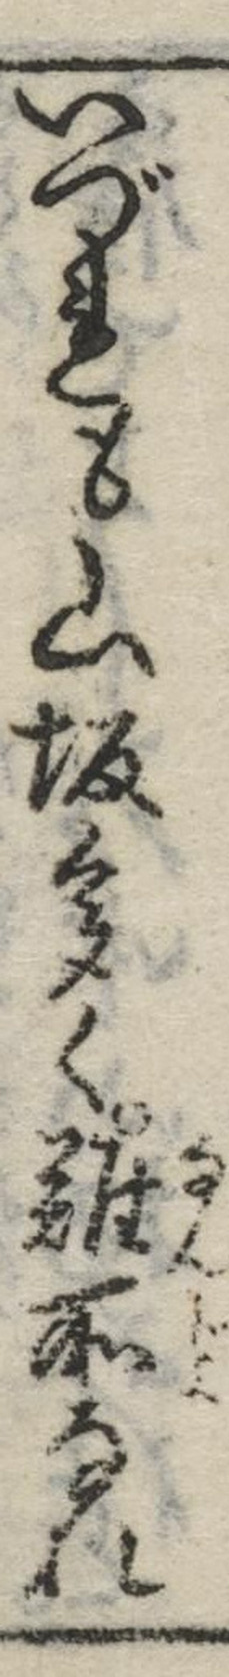いづれも山坂多く。難所なれ
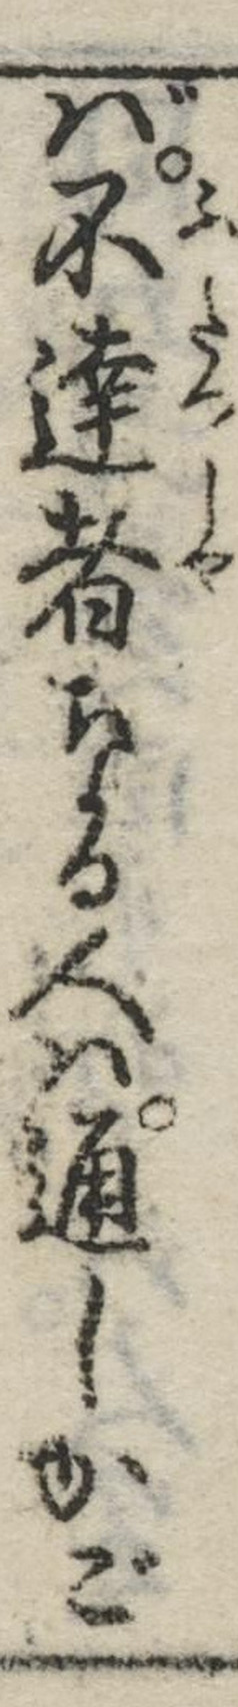ば。不達者なる人は。通しかご
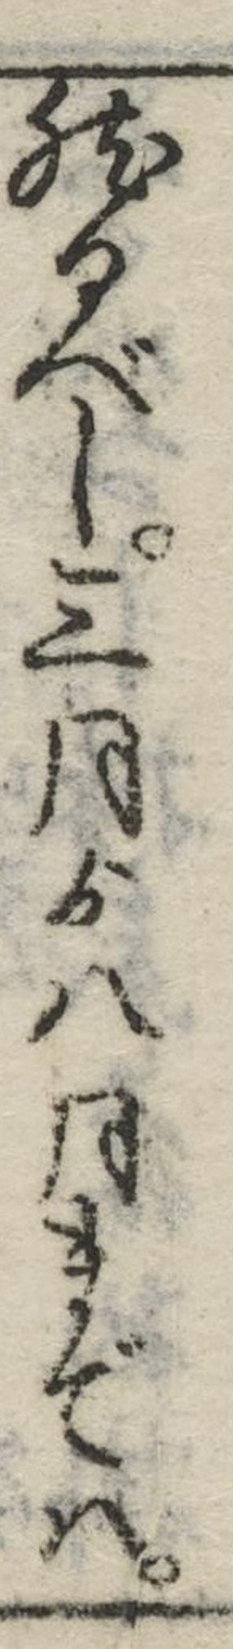然るべし。三月ゟ八月までは。
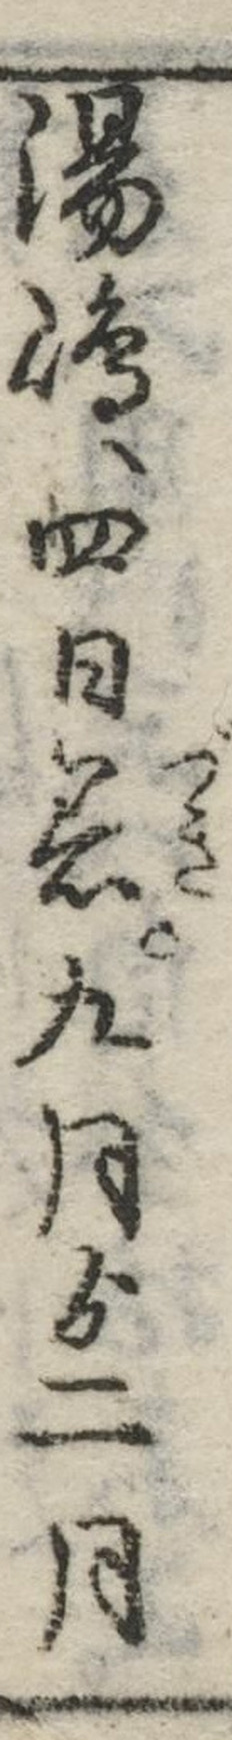湯嶋へ四日着。九月ゟ二月
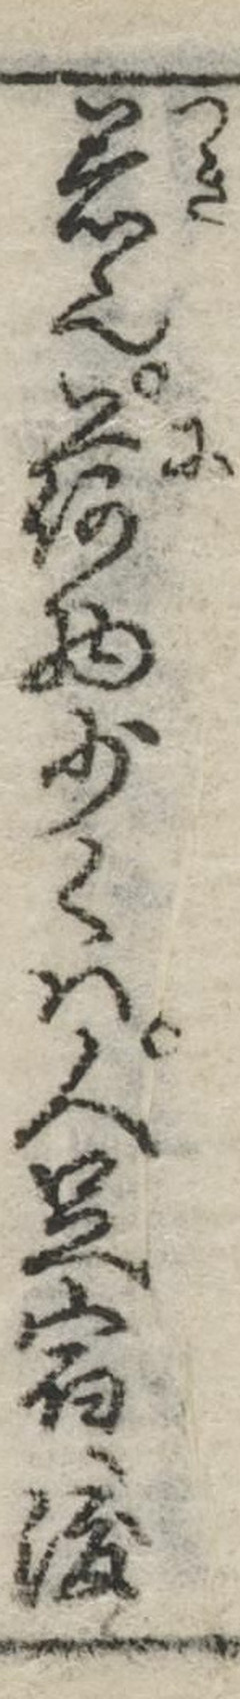着也。荷物少くは。人足宿へ渡
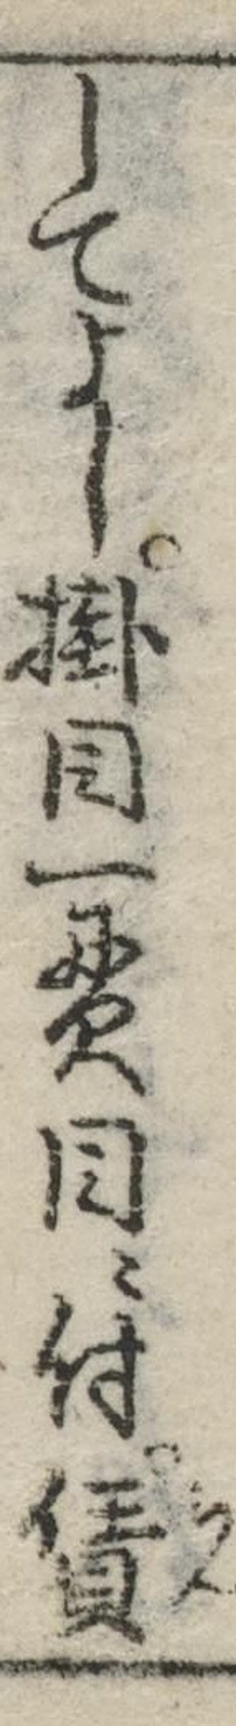してよし。掛目一貫目に付。賃
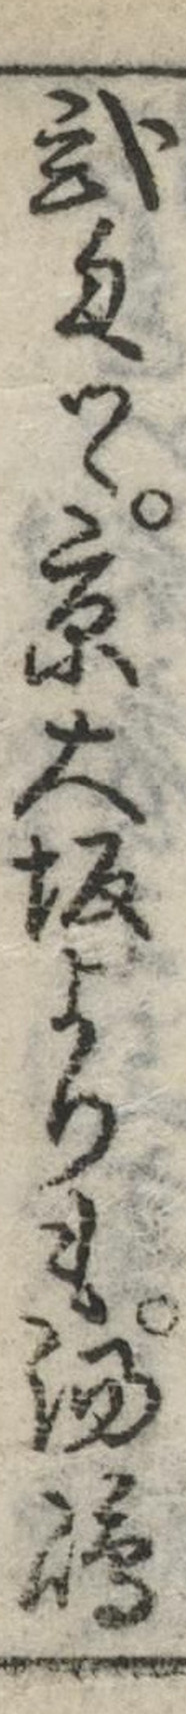弐匁つゝ。京大坂よりも。湯嶋
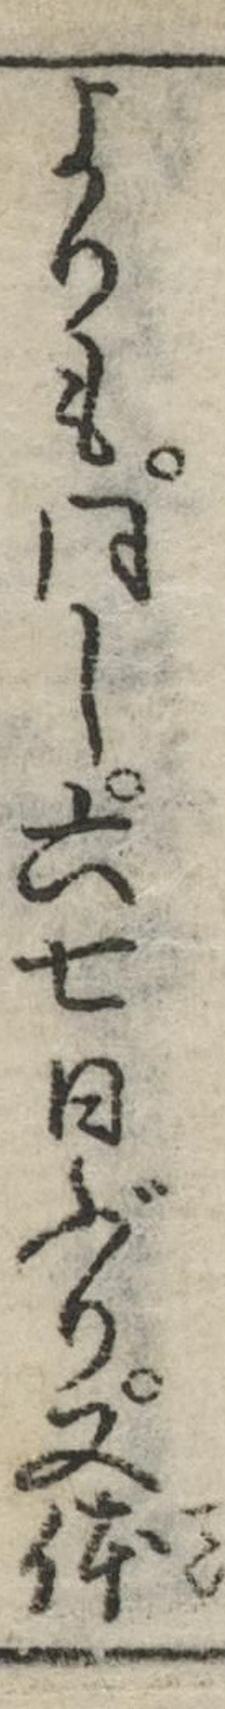よりも。同し。六七日ぶり。又体

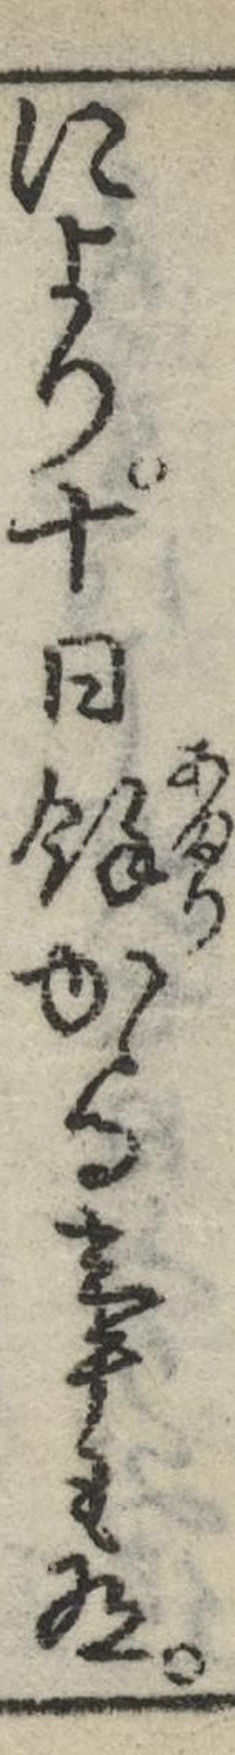により。十日余かゝる事も有。
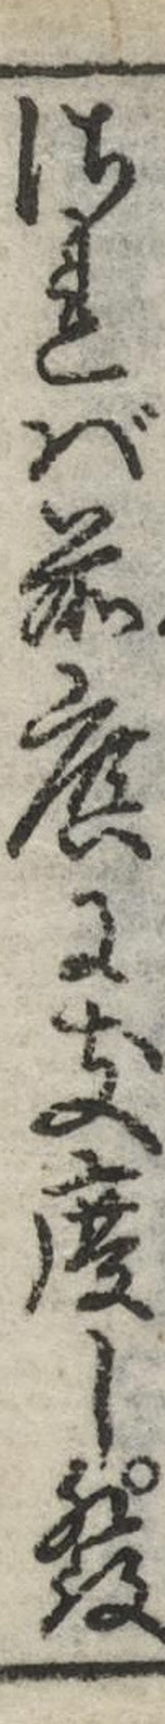されば前広に支度し。発
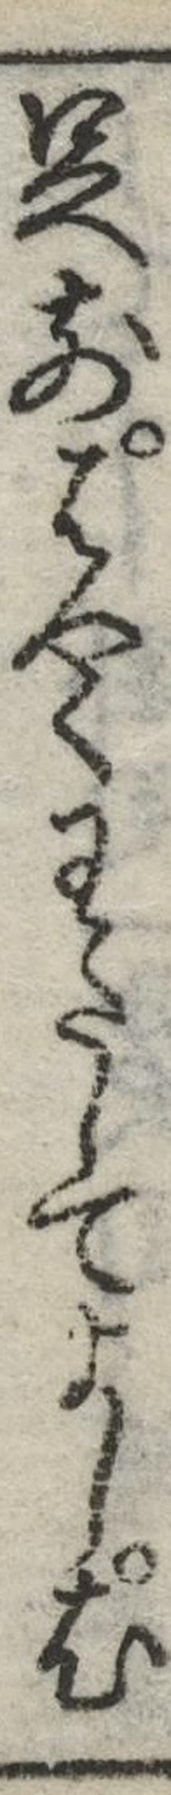足前。はやくわたしてよし。尤
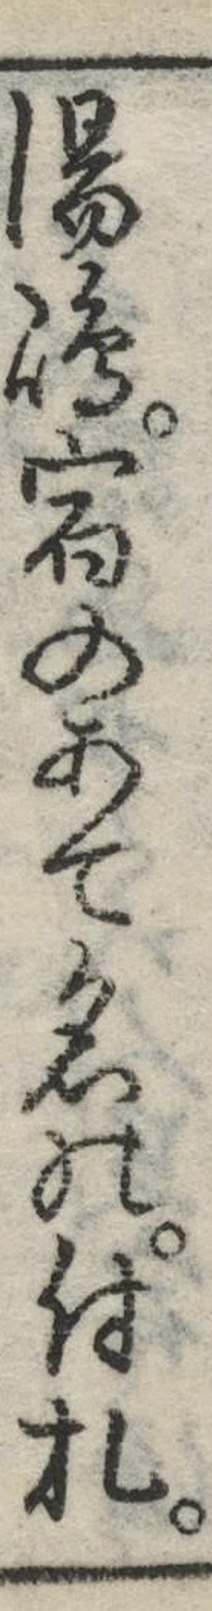湯嶋。宿のあて名の。付札。
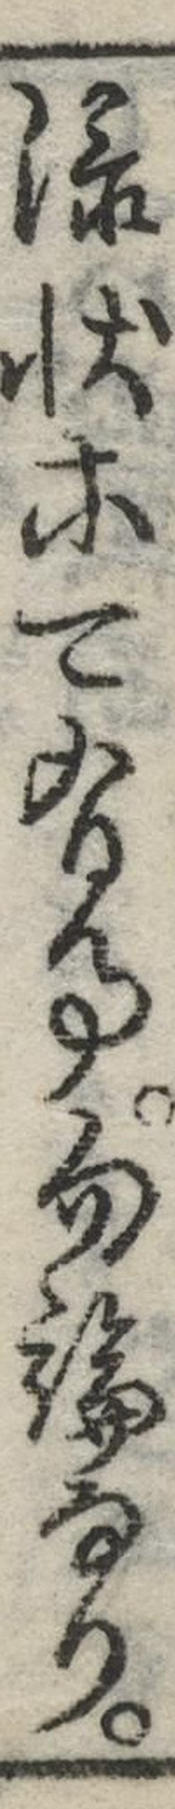添状抔可有事。勿論なり。
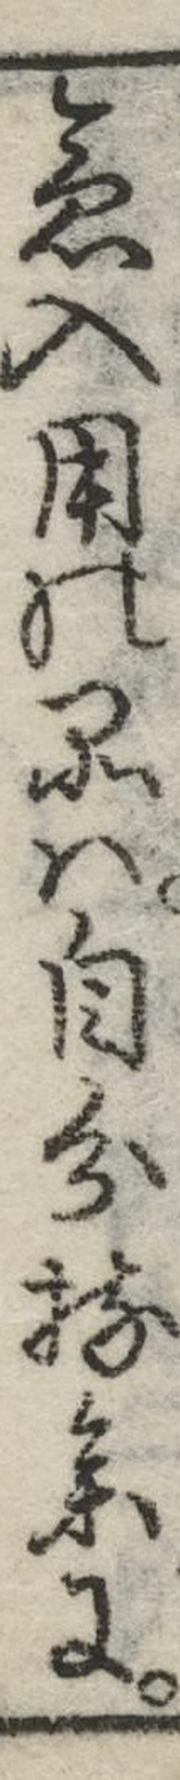急入用の品は。自分持参に。
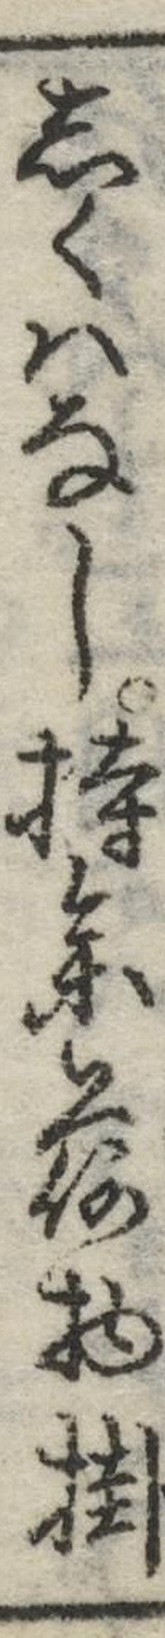しくはなし。持参荷物。掛
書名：但州城崎浴湯辧
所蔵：東京大学地震研究所図書室 Earthquake Research Institute Library, The University of Tokyo, JAPAN
